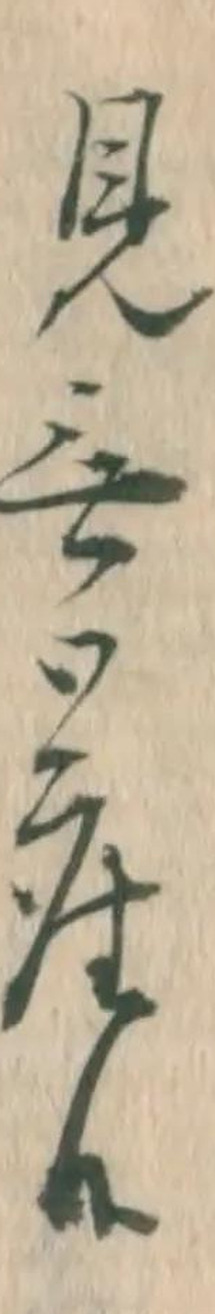見無御座候
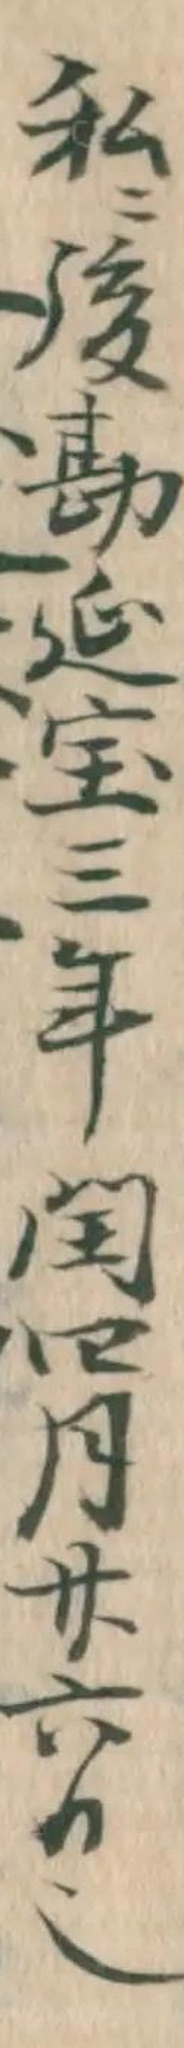私ニ後勘延宝三年閏四月廿六日也
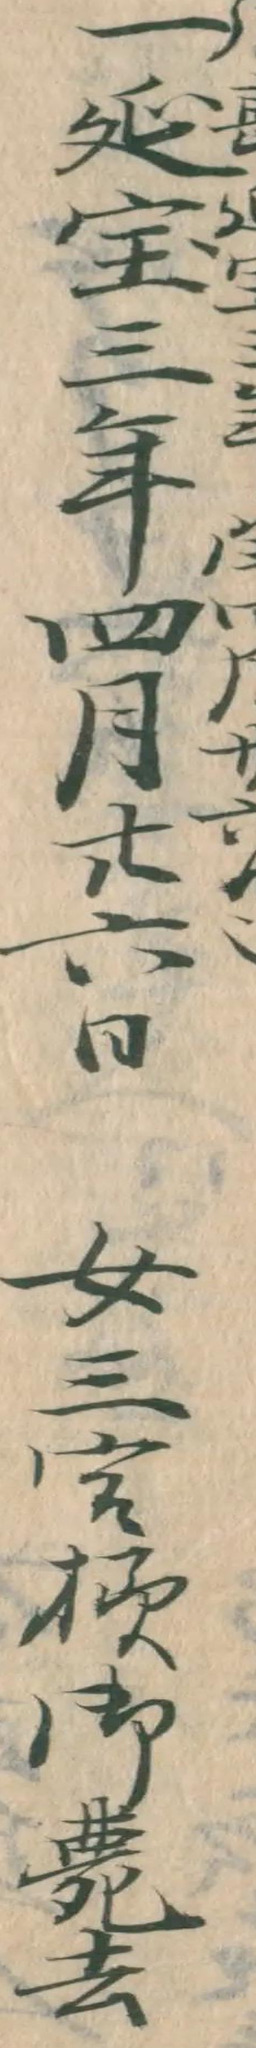一延宝三年四月廿六日女三宮様御薨去
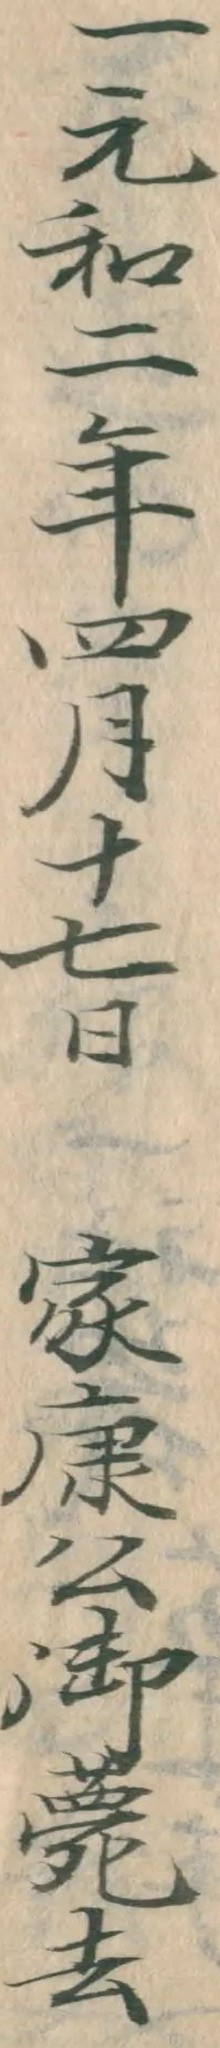一元和二年四月十七日家康公御薨去
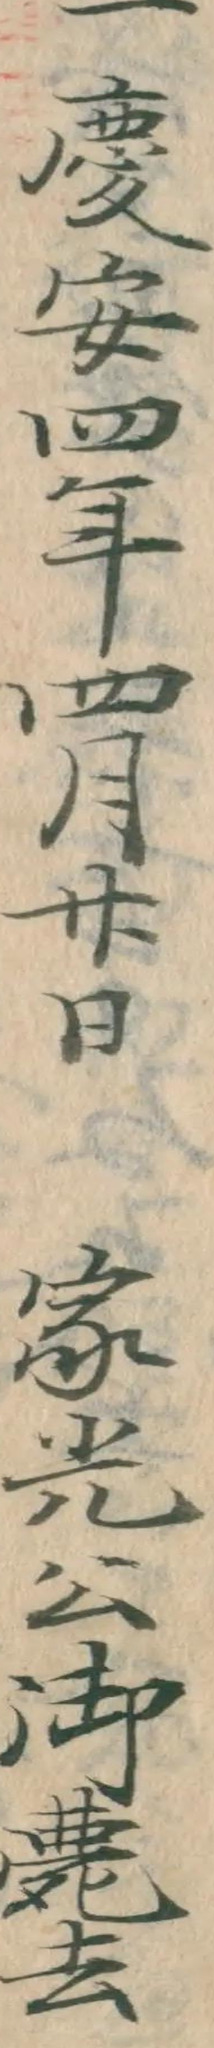一慶安四年四月廿日家光公御薨去
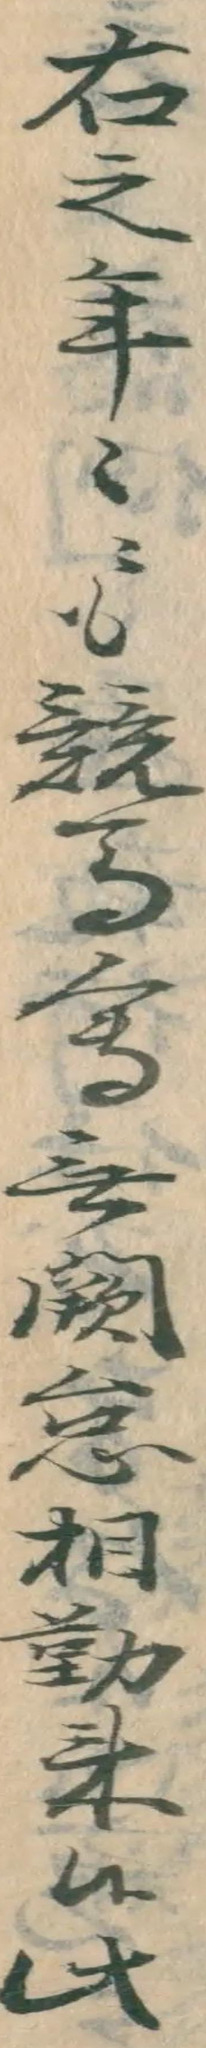右之年々ニも競馬会無闕怠相勤来候此

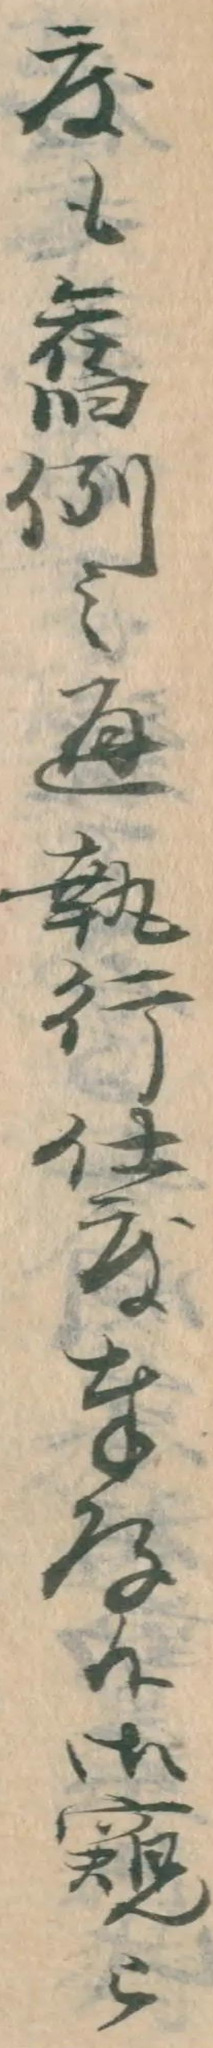度も旧例之通執行仕度奉存候御窺被
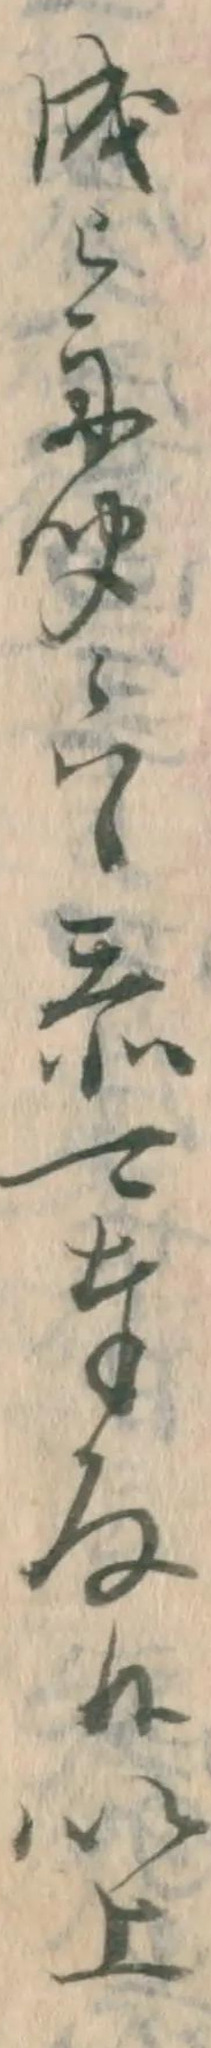成被永聞候はゝ参可奉存候以上
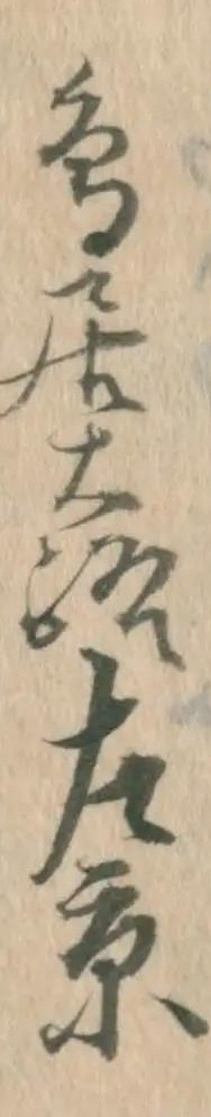鳥居大路左京殿
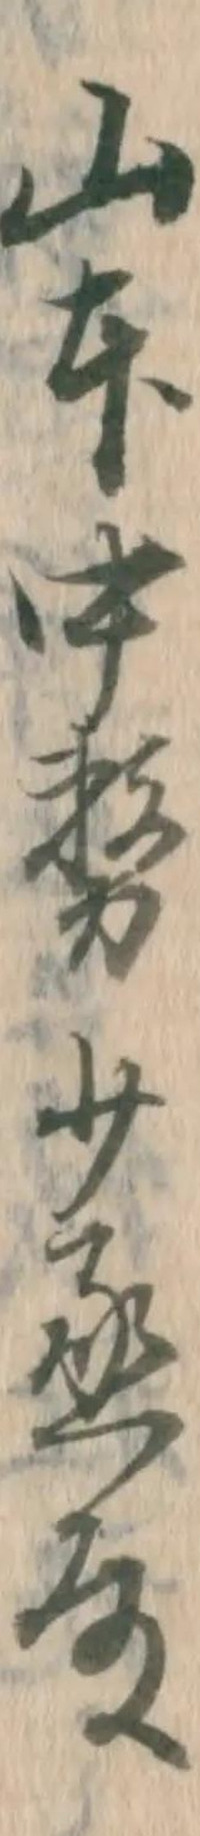山本中務少丞殿
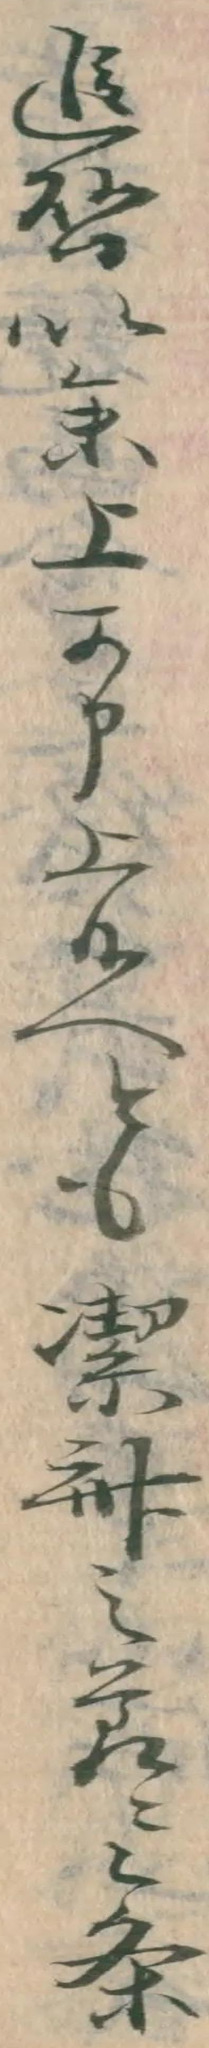追啓以参上可申上候へとも潔斎之節ニ候条
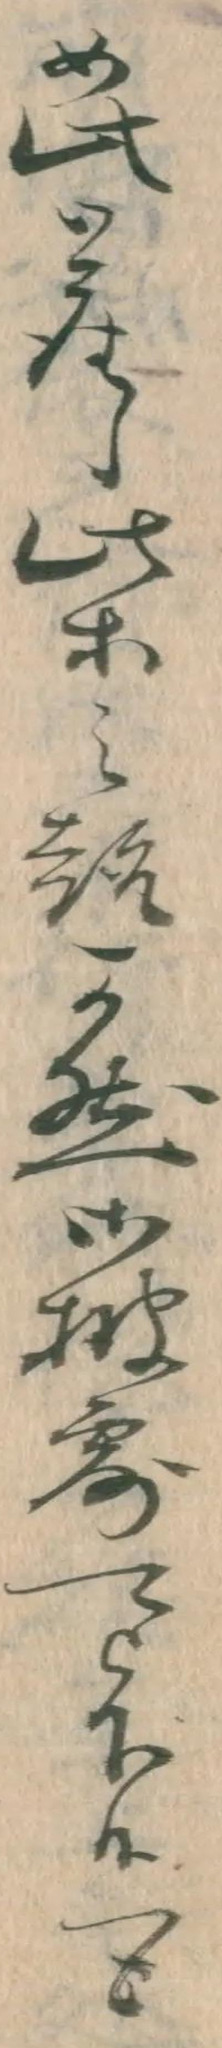如此御座候此等之趣可然御披露可被下候以上
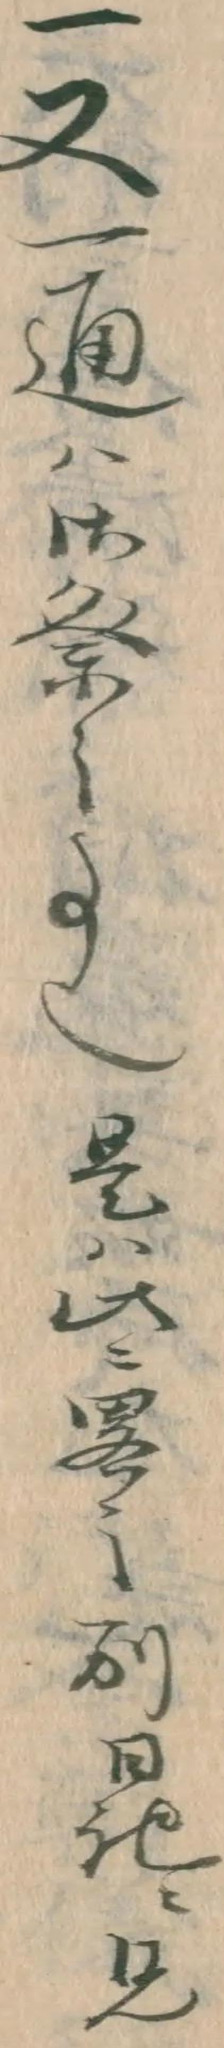一又一通ハ御祭之事也是ハ此ニ略之別日記ニ見
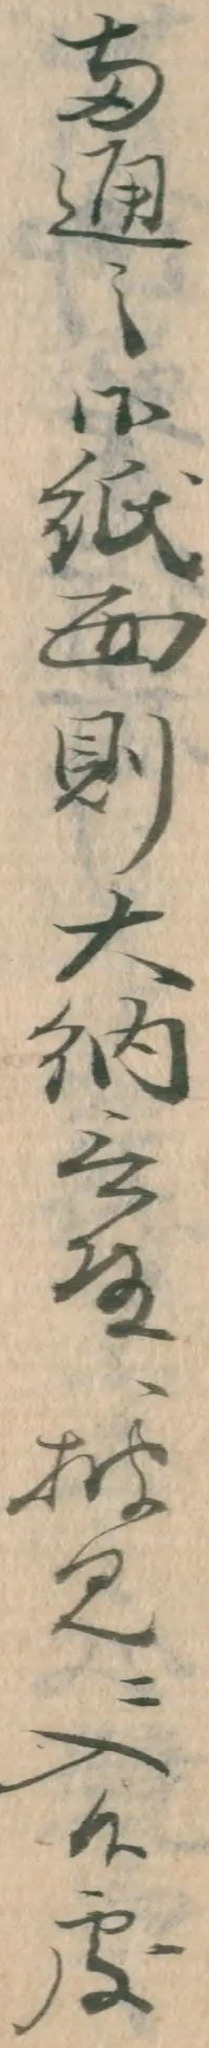両通之御紙面則大納言殿へ披見ニ入候処
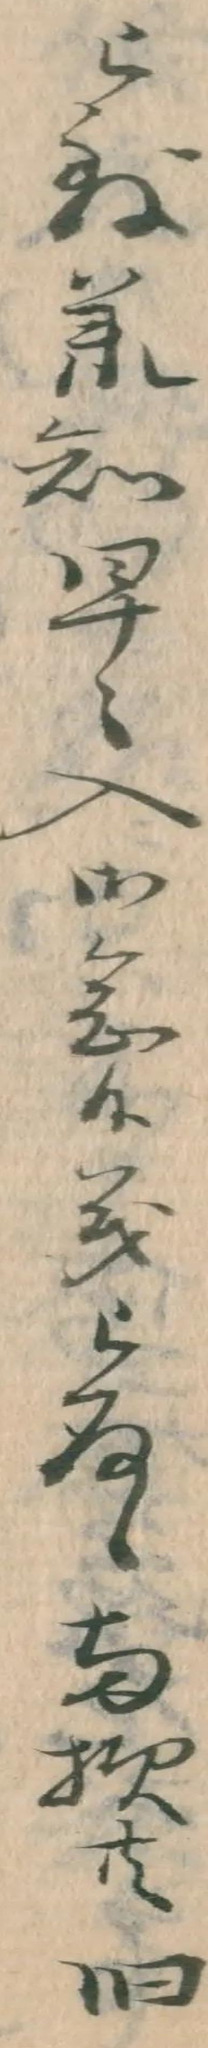被致承知早々入御念候義被存候両様共旧
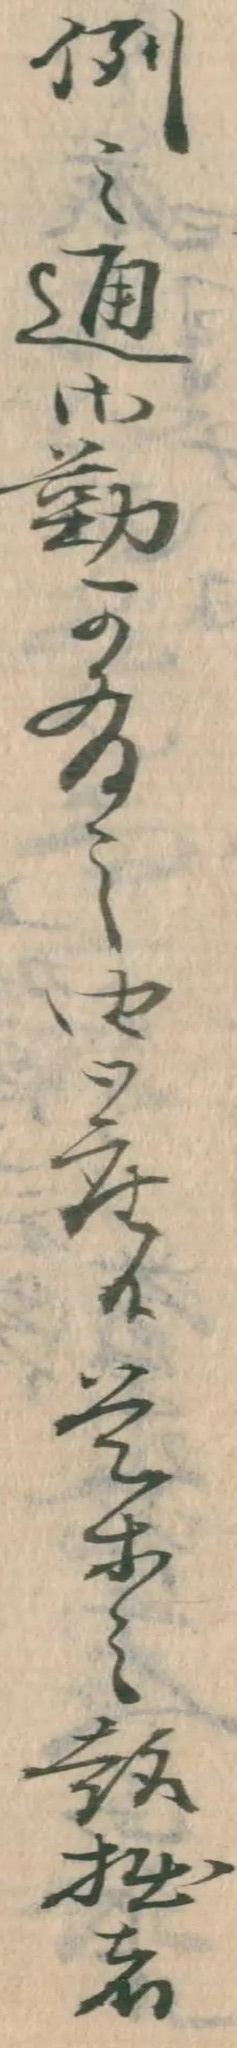例之通御勤可有之由御座候是等之趣拙者
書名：賀茂社記録. 第10冊
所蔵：国立国会図書館 National Diet Library, JAPAN
